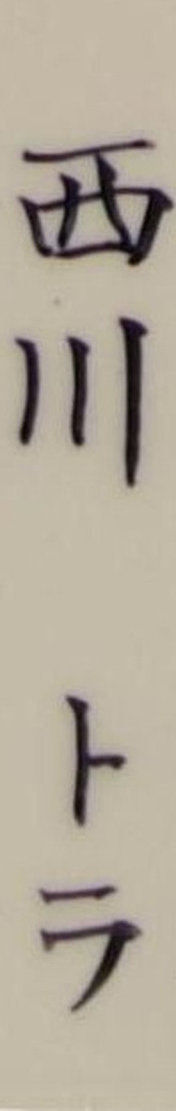西川トラ
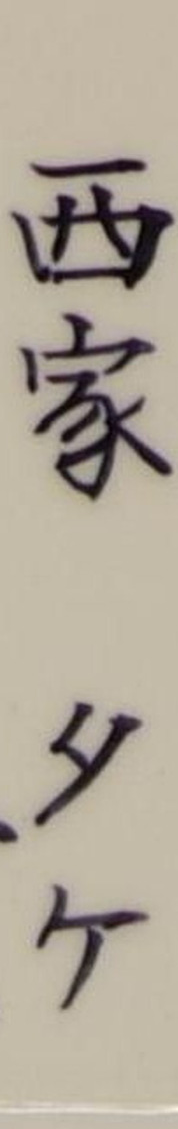西家夕ケ
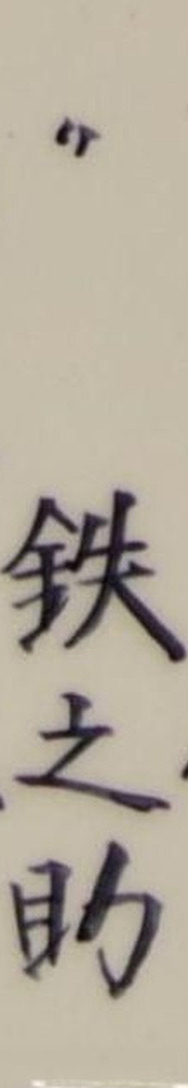鉄之助
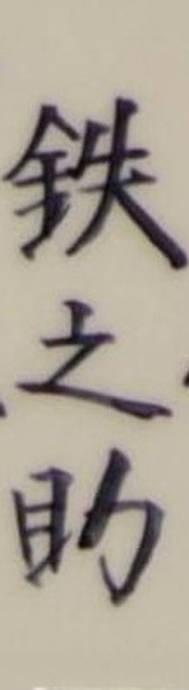鉄之助
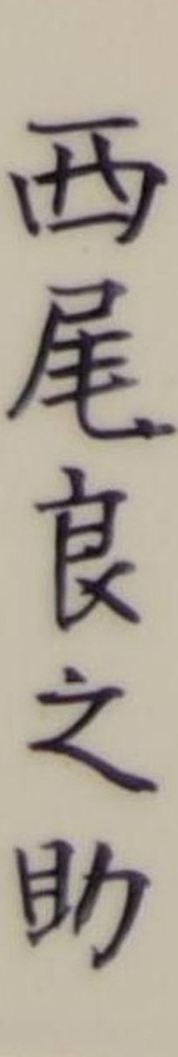西尾良之助
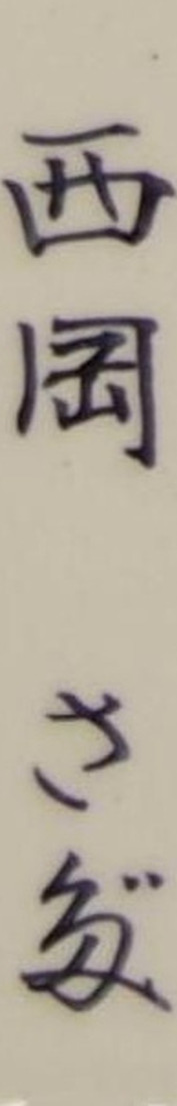西岡さだ
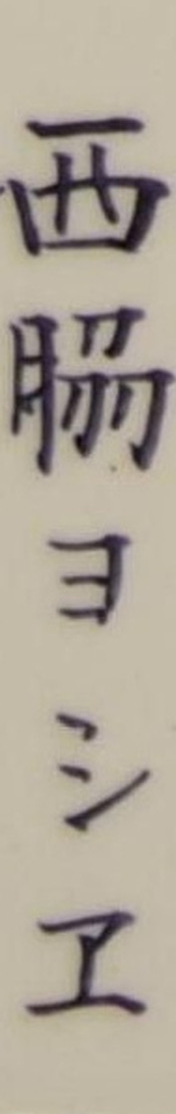西脇ヨシエ
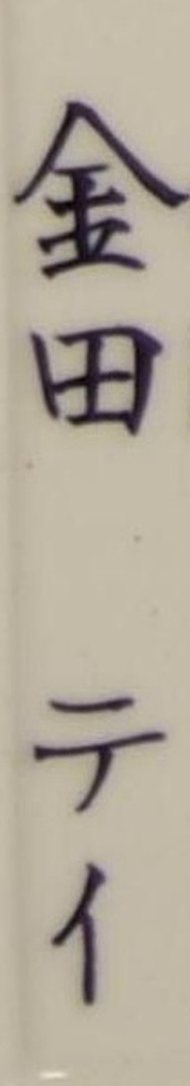金田テイ

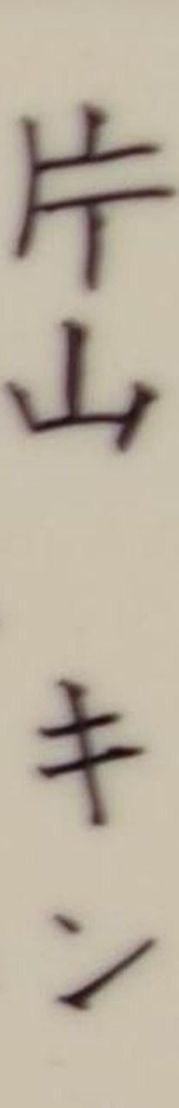片山キン
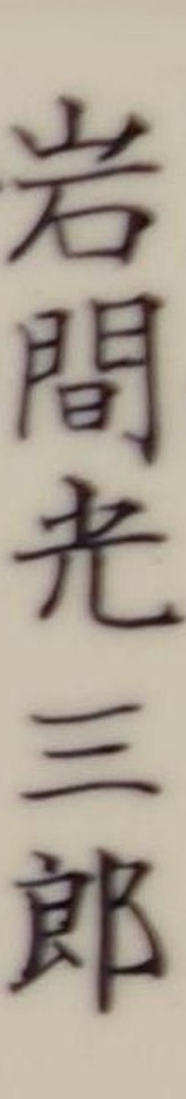岩間光三郎
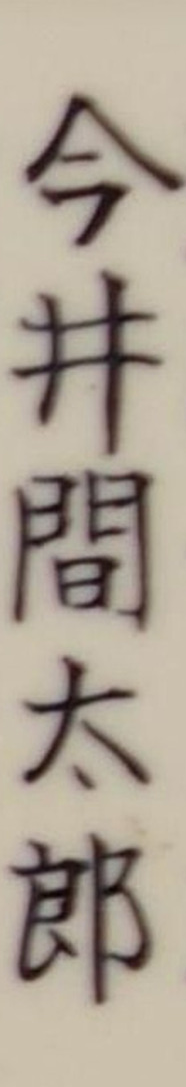今井間太郎
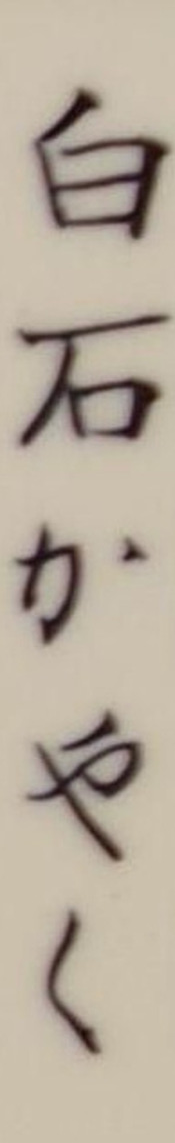白石かやく
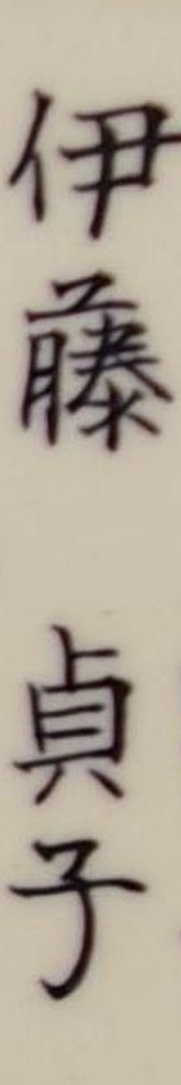伊藤貞子
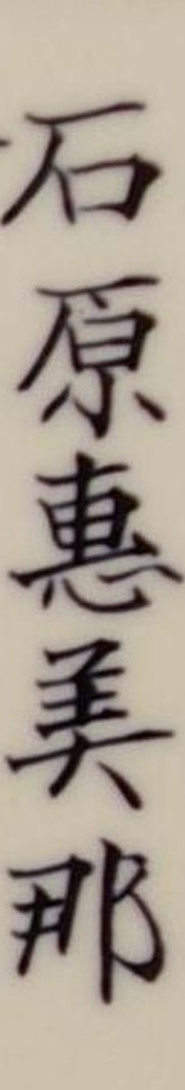石原恵美那
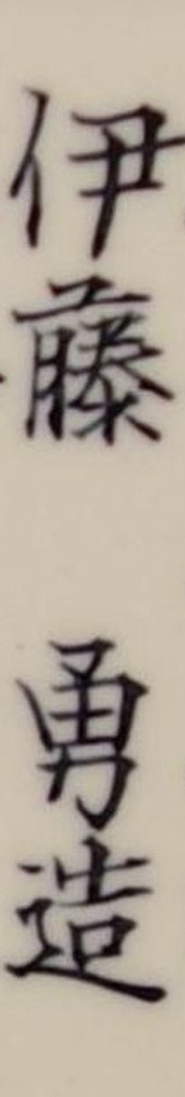伊藤勇造
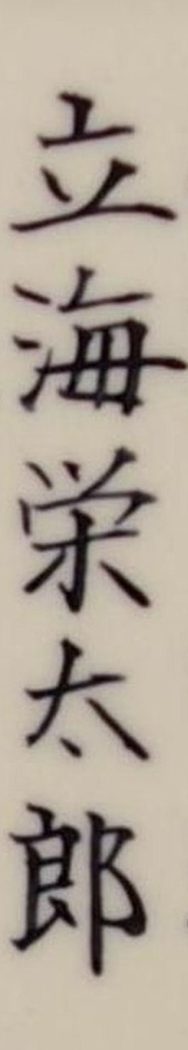立海栄太郎
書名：M~S
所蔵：高野山金剛峯寺
